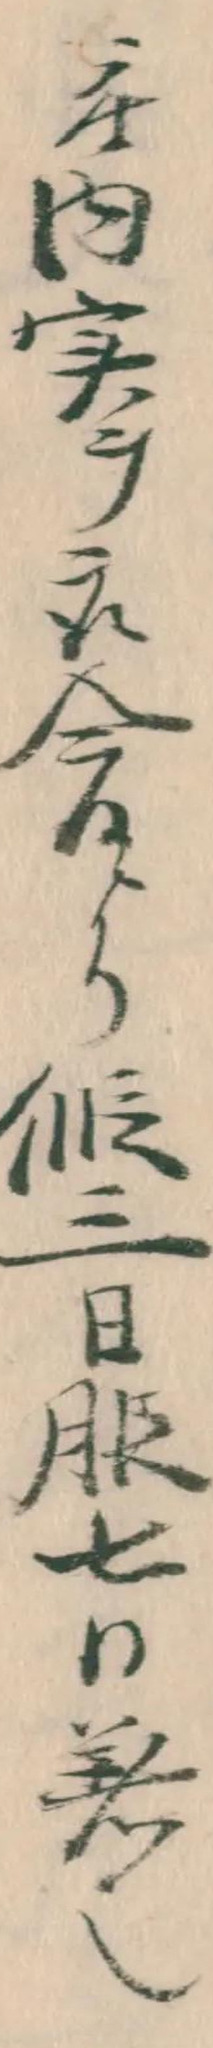ニ付内実ヲ取今日より假三日服七日着也
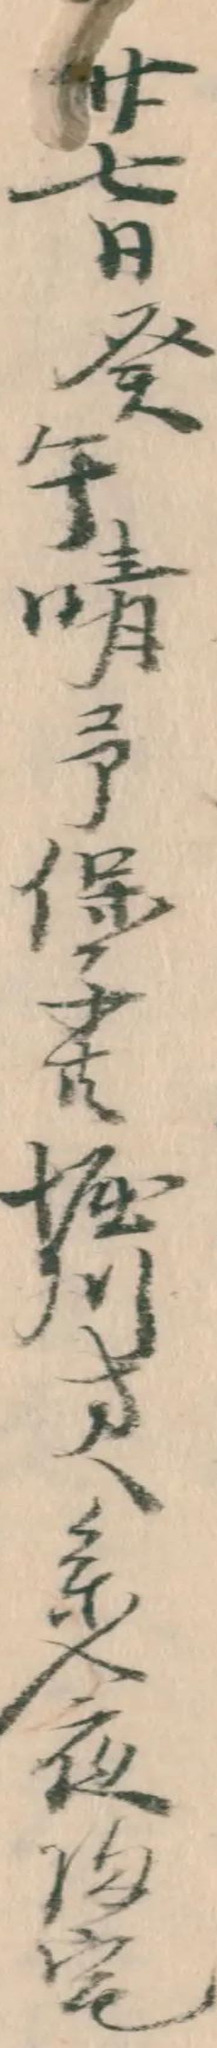廿七日癸午晴予保子共堀川方へ参人夜帰宅
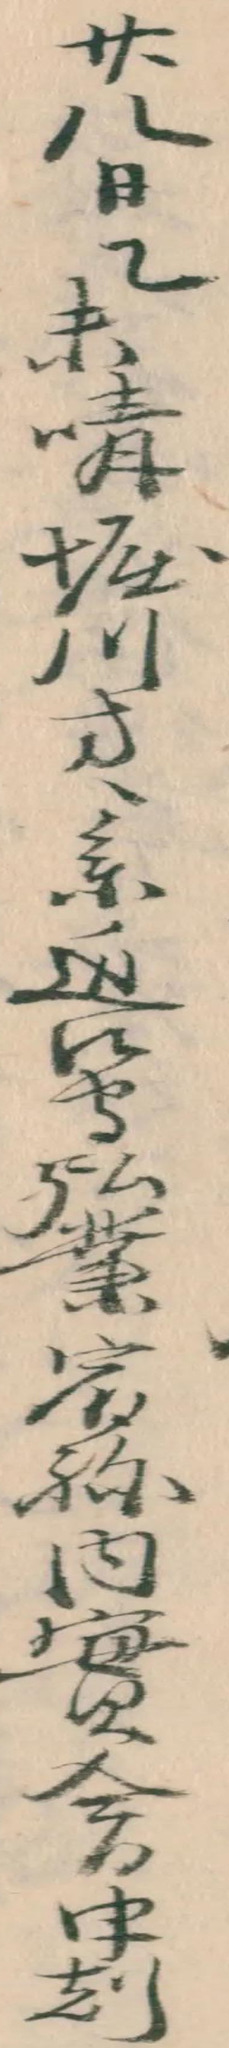廿八日乙未晴堀川方へ参近江守弘業宿祢内實今日申刻
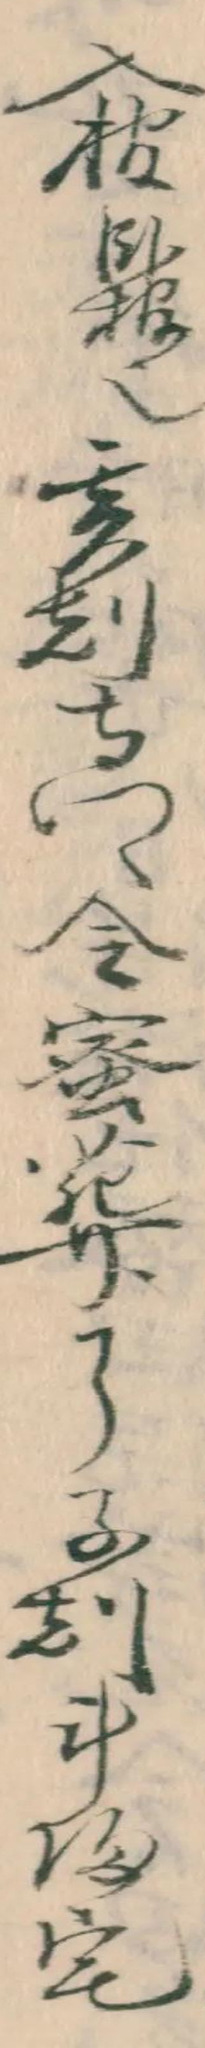入棺臥也亥刻寺門へ令蜜葬了子刻斗帰宅
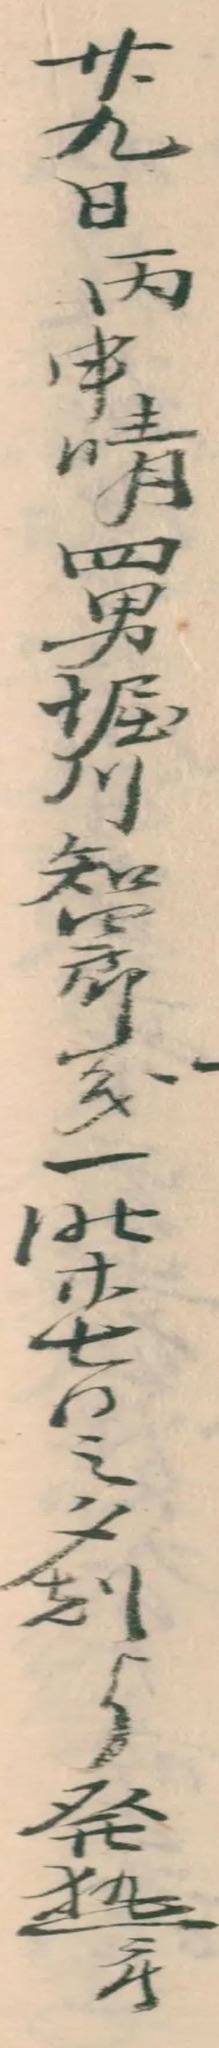廿九日丙申晴四男堀川知四郎義一昨廿七日之夕刻より発熱ニ付
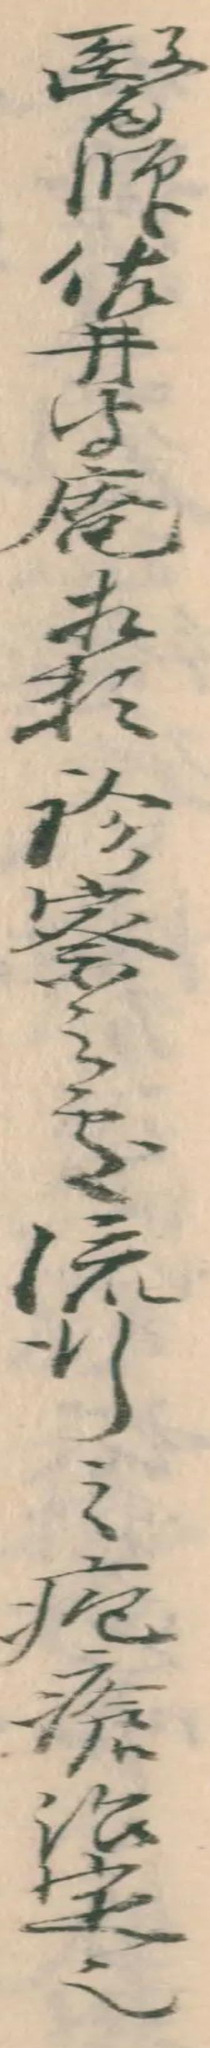醫師佐井聞庵相頼診察之處流行之疱瘡治定也
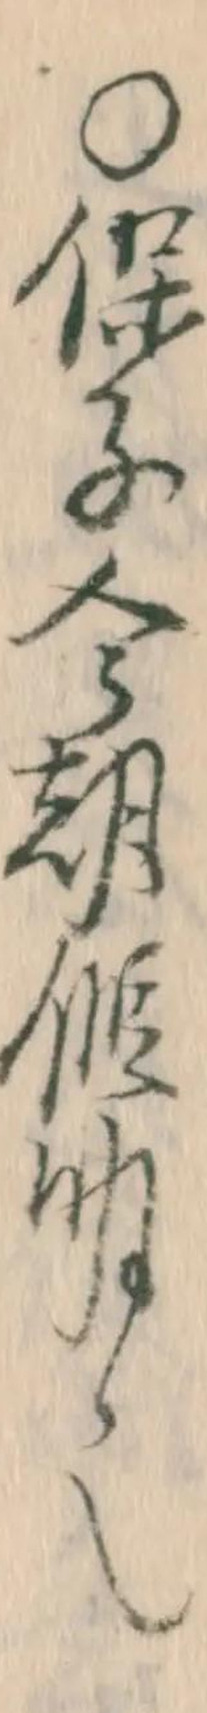○保子今朝假明也
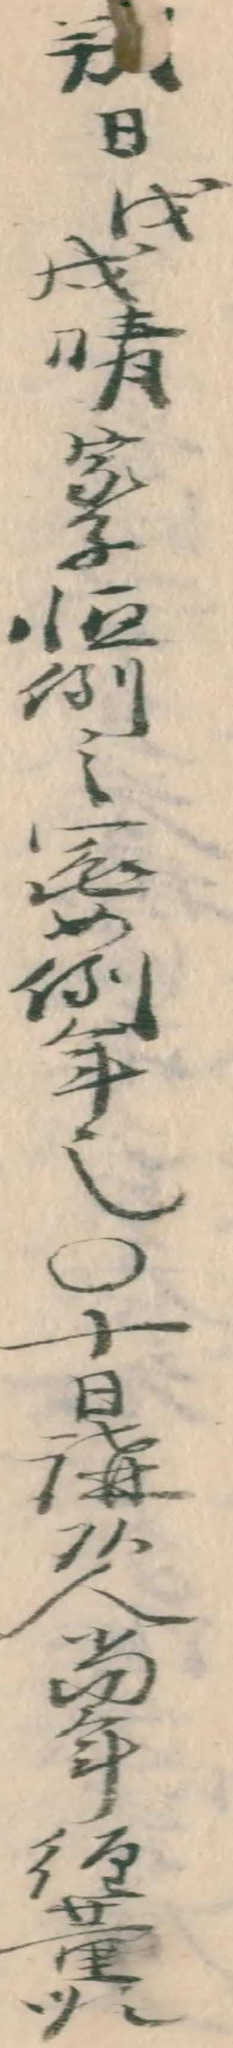朔日戊戌晴家子恒例之鬮如例年也○十日講頭人當年経董順
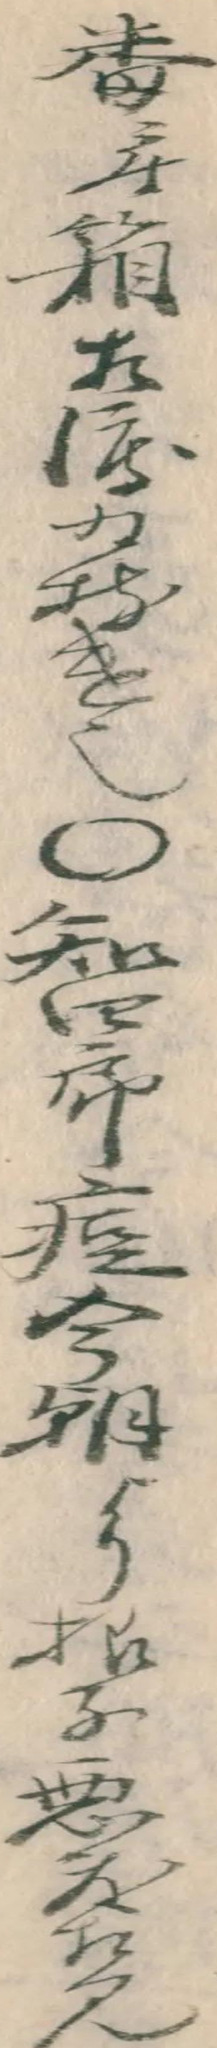番ニ付箱相渡為持遣也○知四郎痘今朝より様子悪敷相見
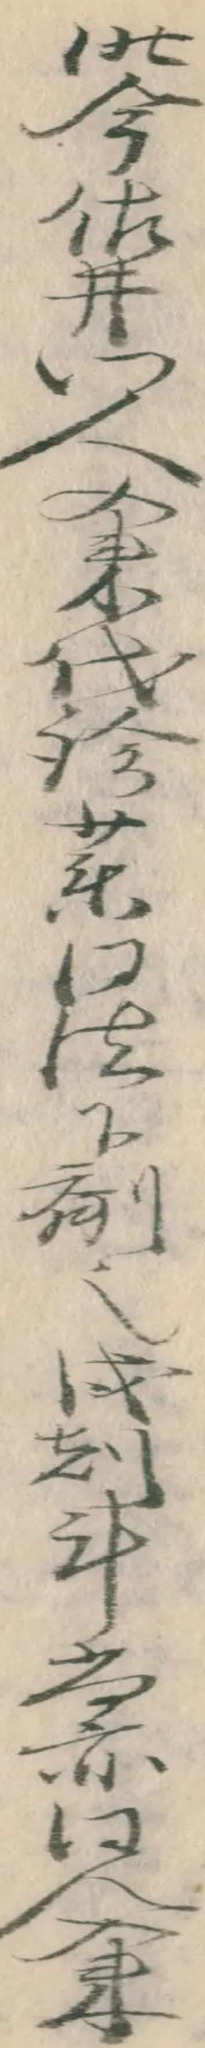昨今佐井郷人入来代診薬同法下剤也戌刻計尚亦同人入来
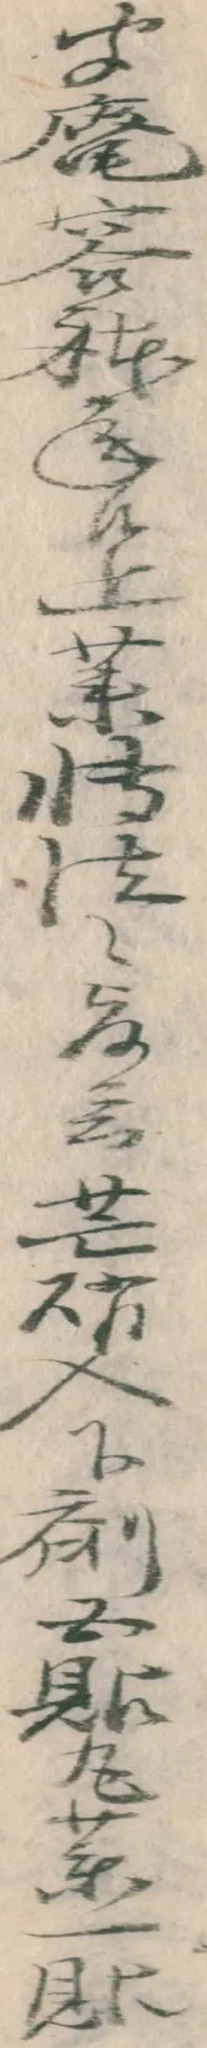聞庵容躰承候上薬轉法之旨ニ而芒硝入下剤五貼丸薬一貼
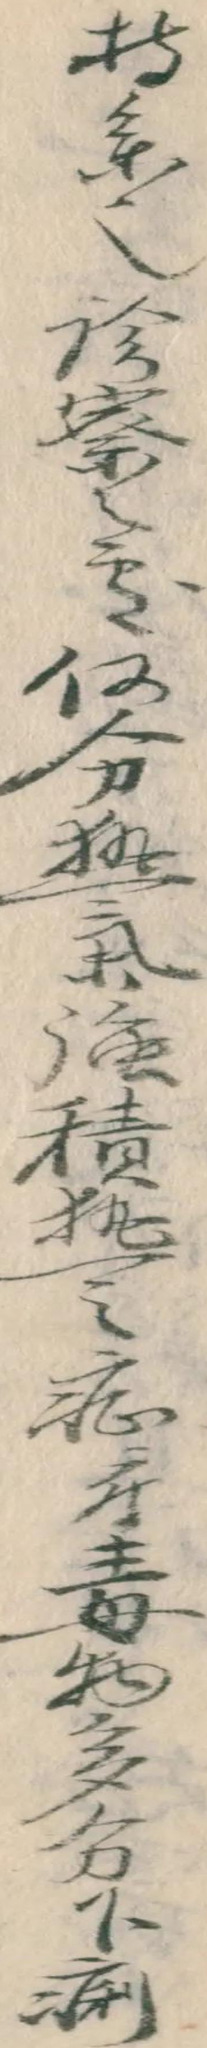持参也診察之處何分熱氣強積熱之症ニ付毒物多分下痢
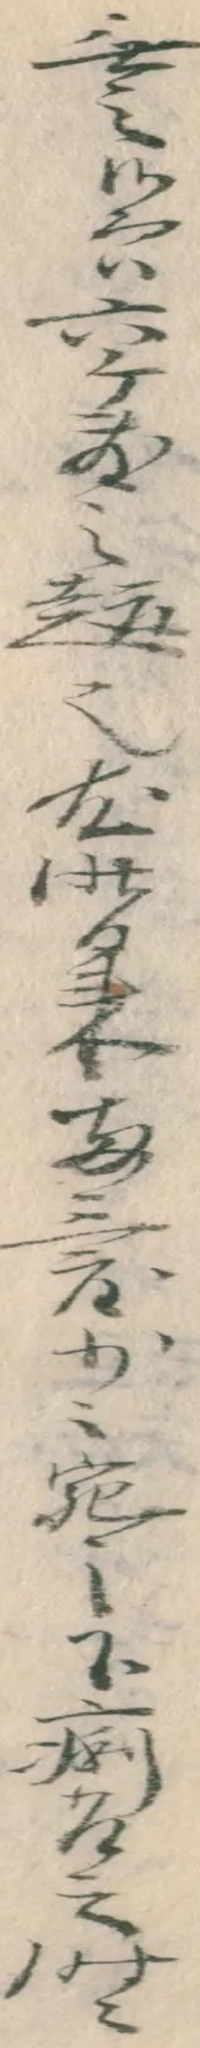無之候而ハ六ケ度之趣也尤昨日来両三度少々宛之下痢有之時々
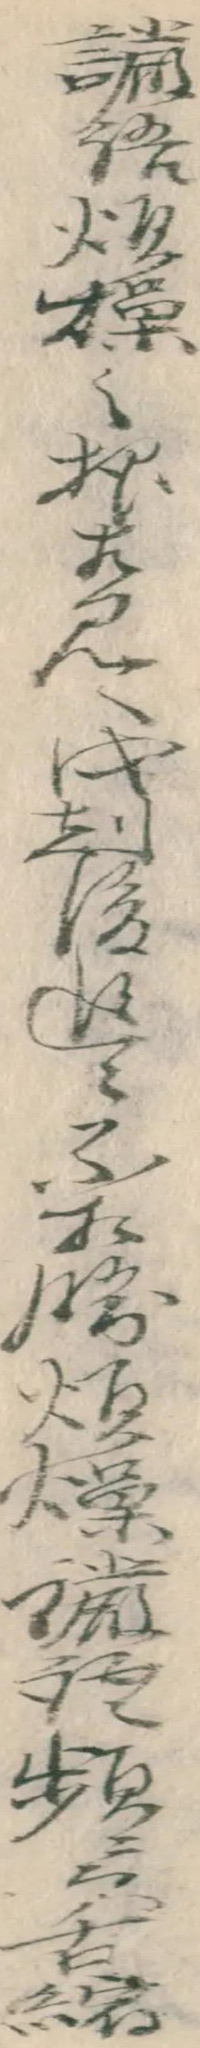譫語煩操之様相見へ戌刻後追々不相勝煩燥譫語体頻ニ而舌縮
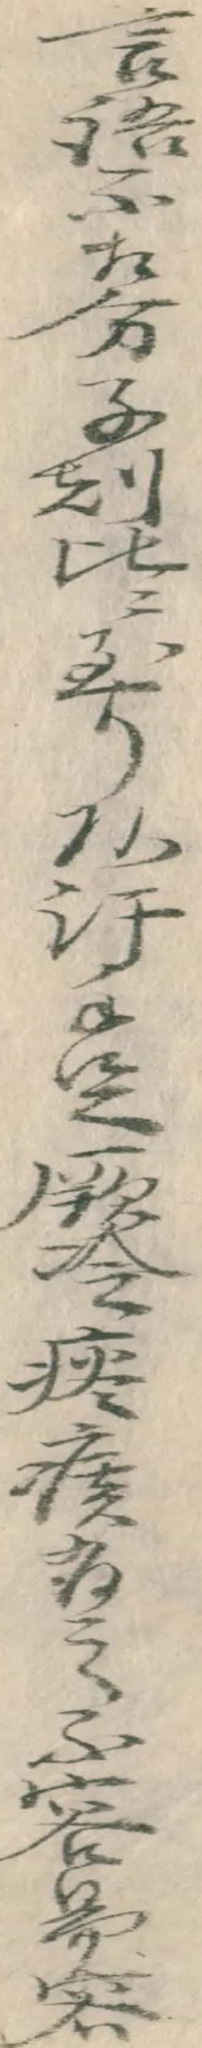言語不相分子刻比ニ至り頭汗手足厥冷痰癪有之不容易容
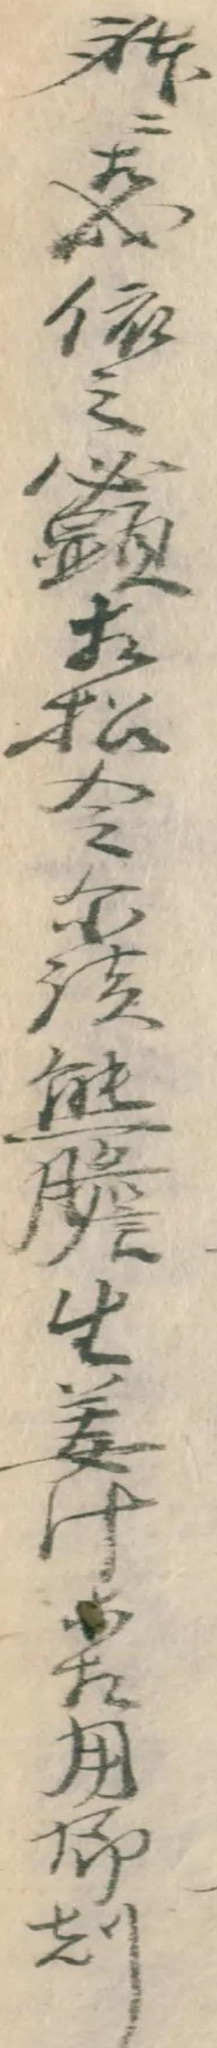躰ニ相成依之必顕相招令尓談熊膽生姜汁等相用即刻
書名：賀茂社記録. 第66冊
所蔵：国立国会図書館 National Diet Library, JAPAN
